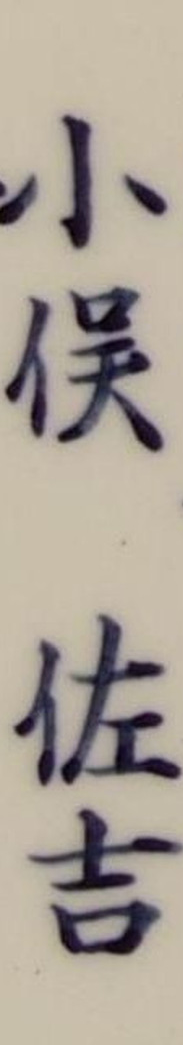小俣佐吉

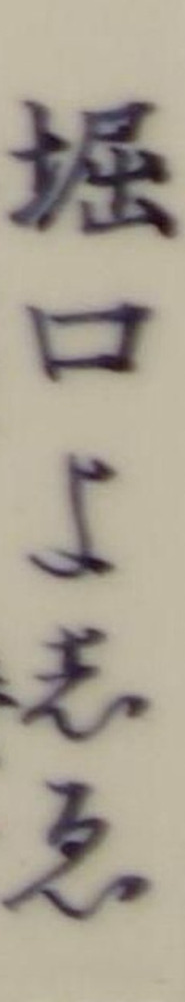堀口よしゑ
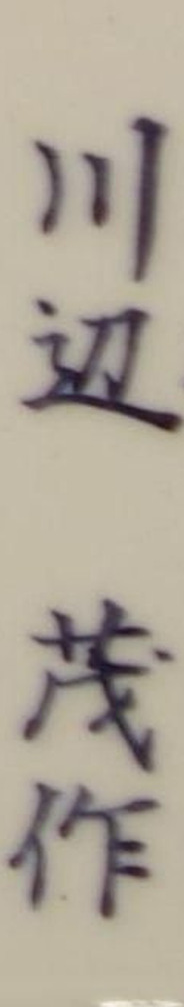川辺茂作
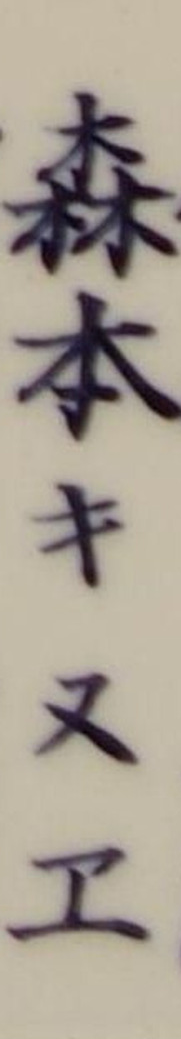森本キヌヱ
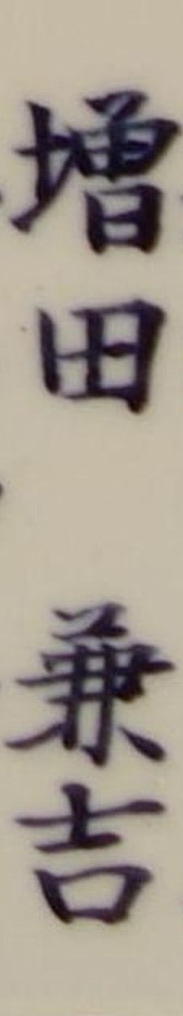増田兼吉
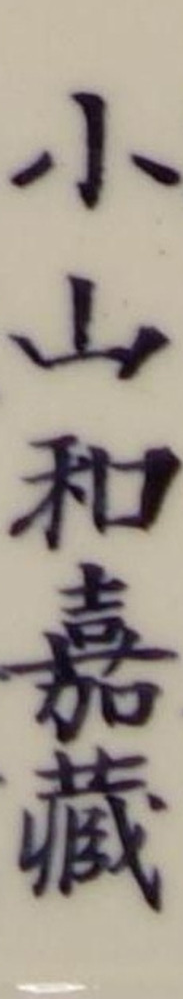小山和嘉蔵
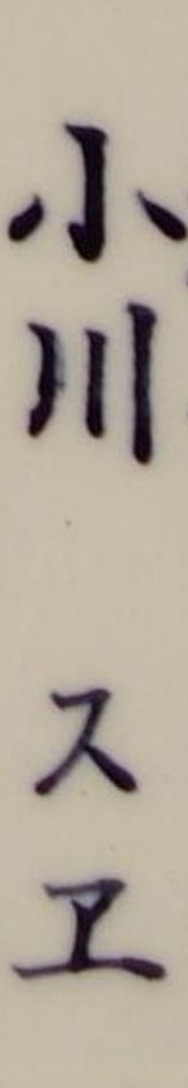小川スヱ
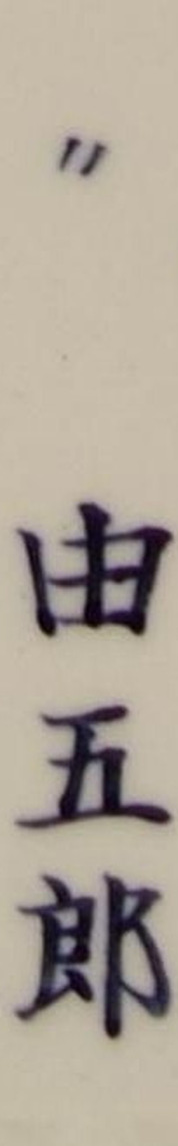由五郎
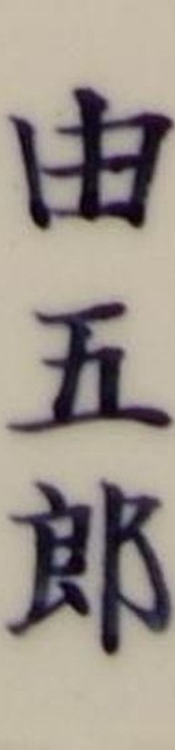由五郎
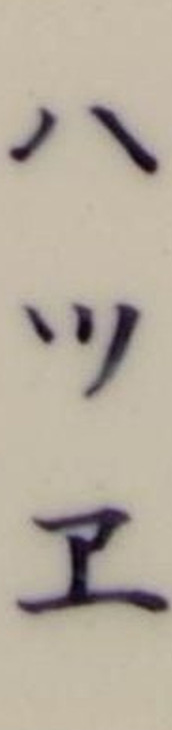ハツヱ
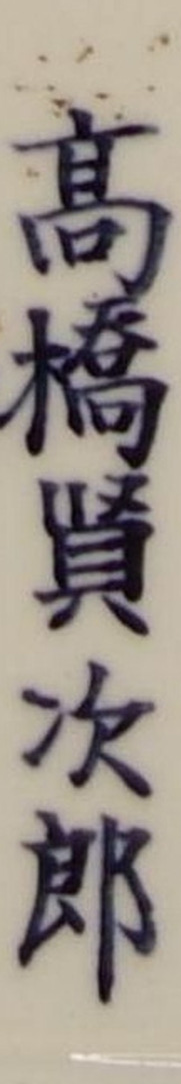高橋賢次郎
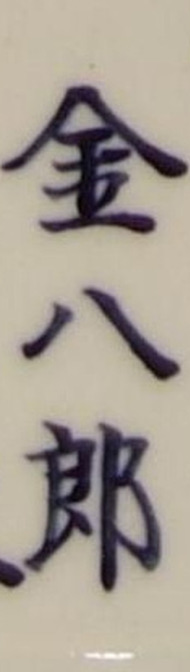金八郎
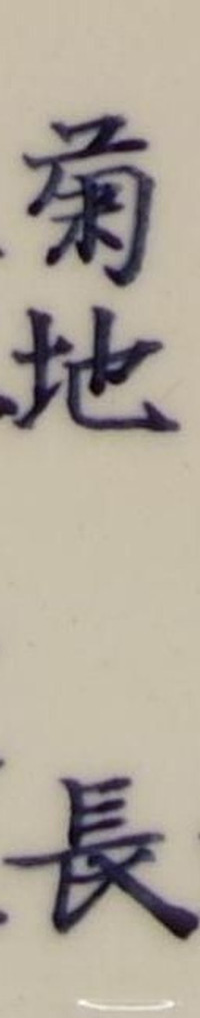菊地長
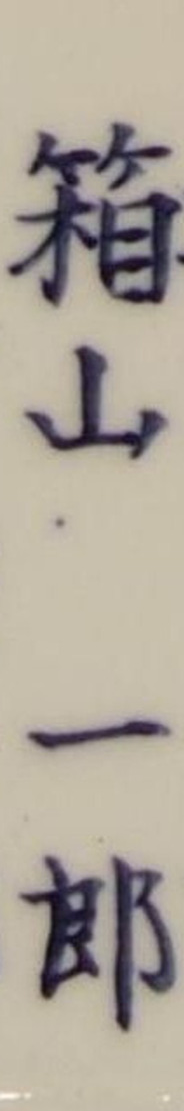箱山一郎
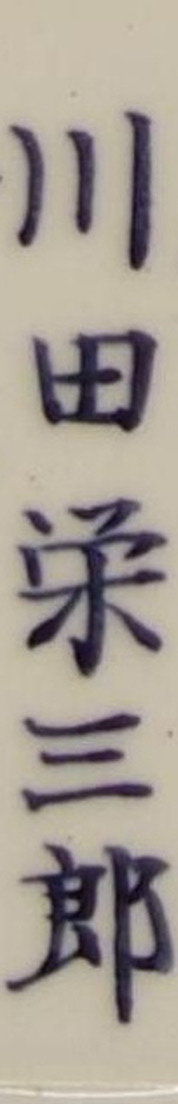川田栄三郎

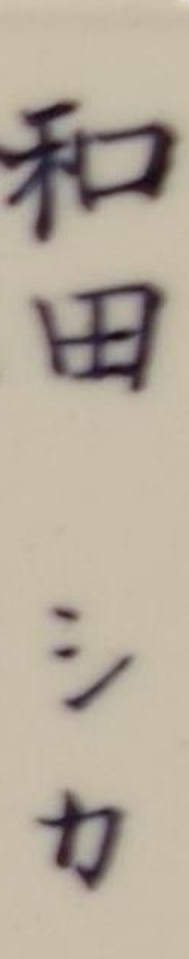和田シカ
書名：M~S
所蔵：高野山金剛峯寺
